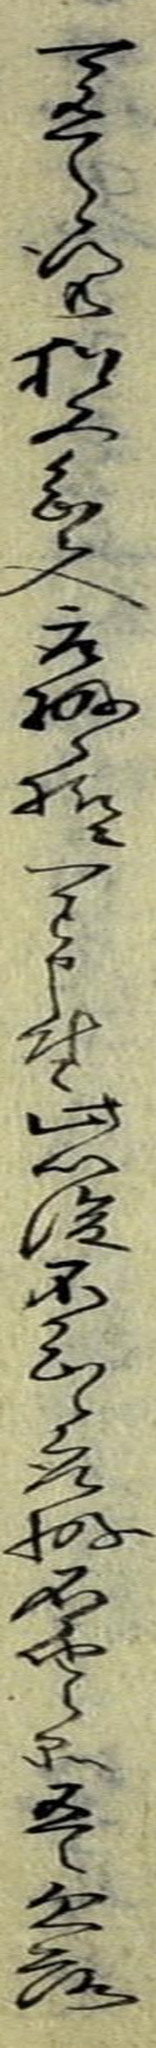可有之候得共猶又念に入取扱候様に可被申付候此以後不念候取扱不届之品有之欠落
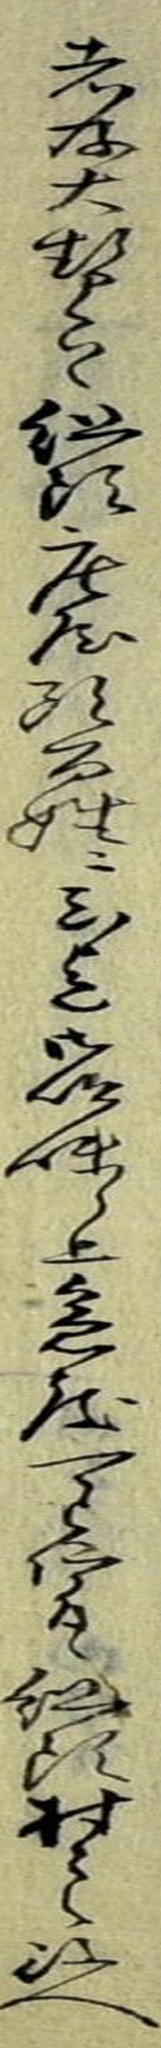者及大勢候はゝ組頭庄屋頭百姓に至迄御吟味之上急度可被仰付候組頭村々之役人
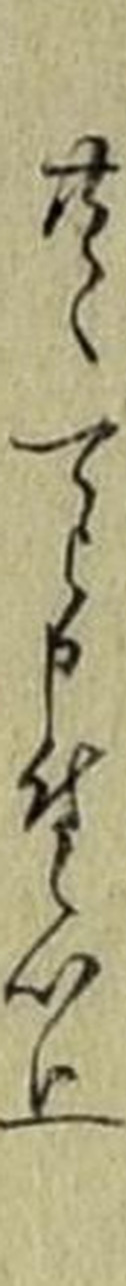共へ可被申付候以上
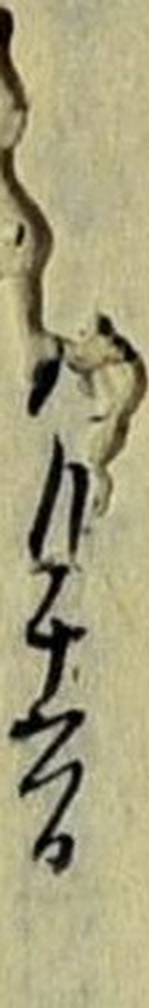八月十六日
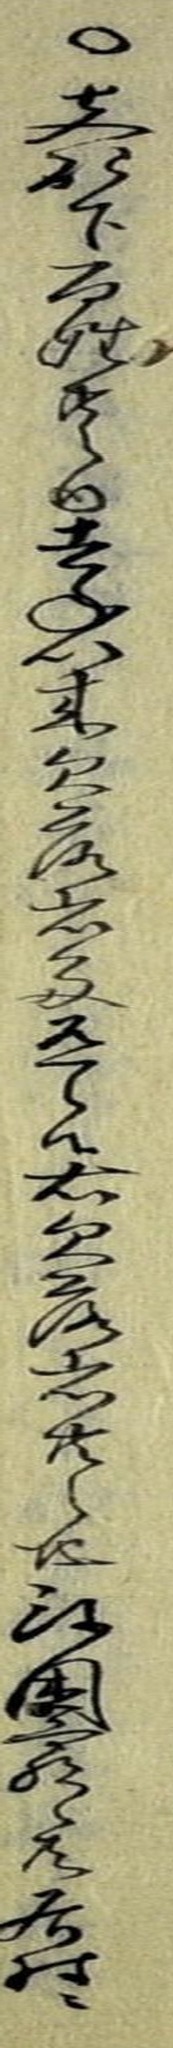〇支配下百姓共之内去年以来欠落者多有之候右欠落者共之儀致困窮候共居村に
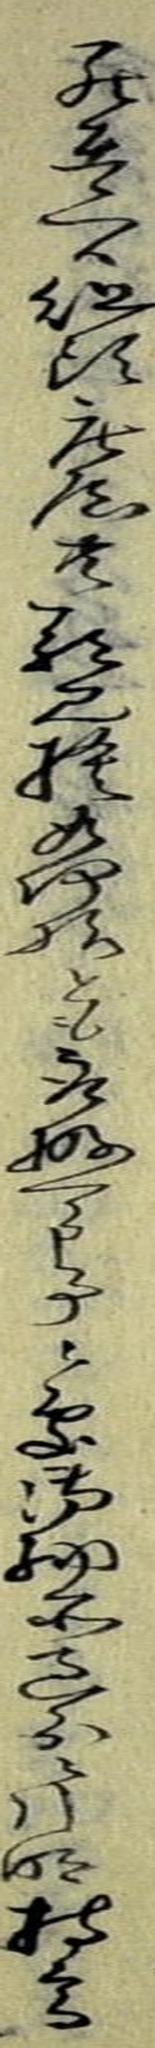罷在候へは組頭庄屋共難見捨如何様とも取扱可申事候処御納所過分に引明持高
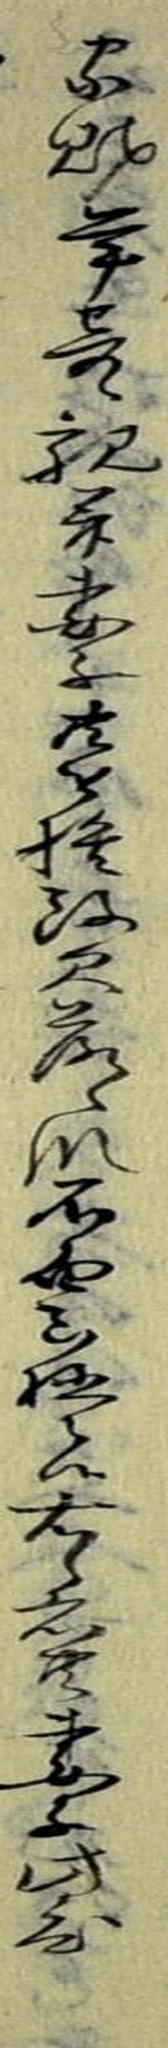家財年寄へ親并妻子を捨致欠落候段不届至極に候右之者共妻子此度
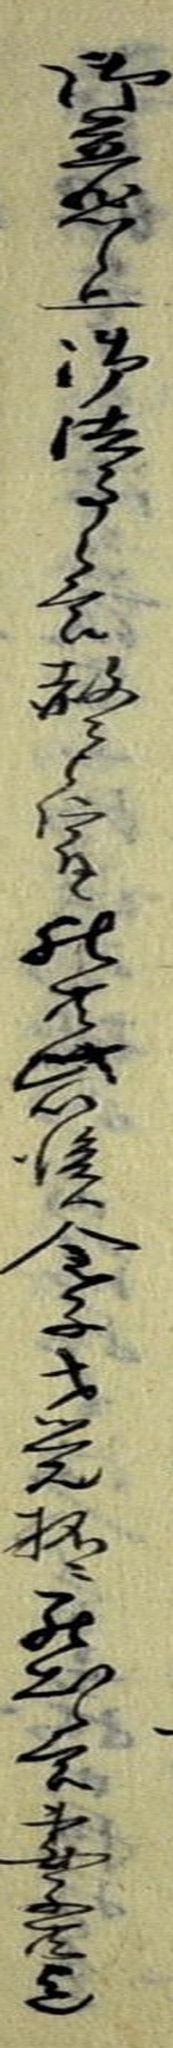御慈悲之上御法事之節赦に被仰付候然共此以後は金子才覚抔に罷出候節妻子共迄
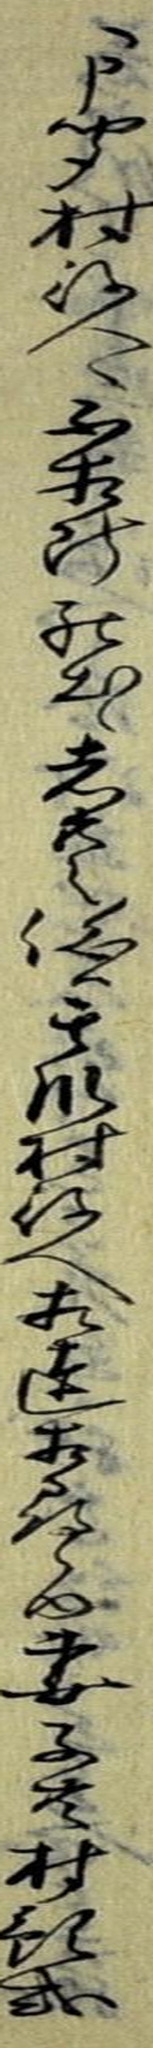へ申聞村役人へ不相断罷出候者共之儀は其段村役人相達相尋候内妻子共村預或
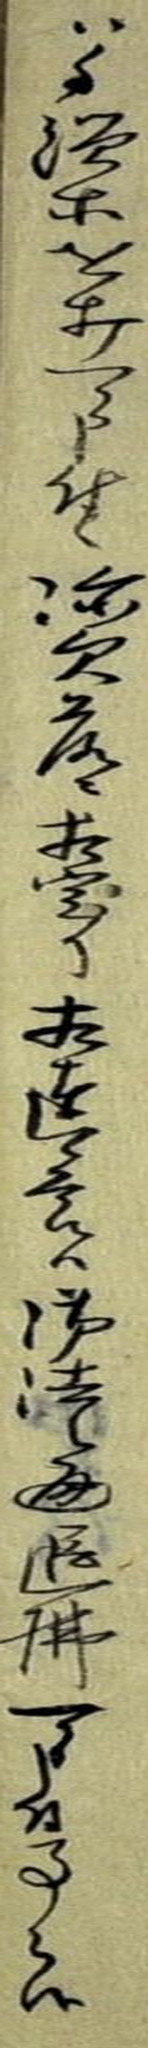は手鎖等を打可申付候弥欠落に相定り相達候節は御法之通追払可申付事に候
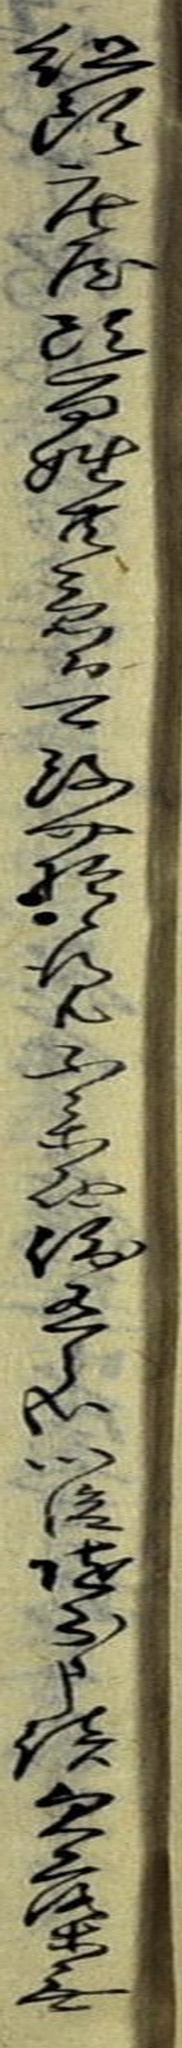組頭庄屋頭百姓共兼而可致介抱候得共不参届儀有之哉以後随分申談欠落等無
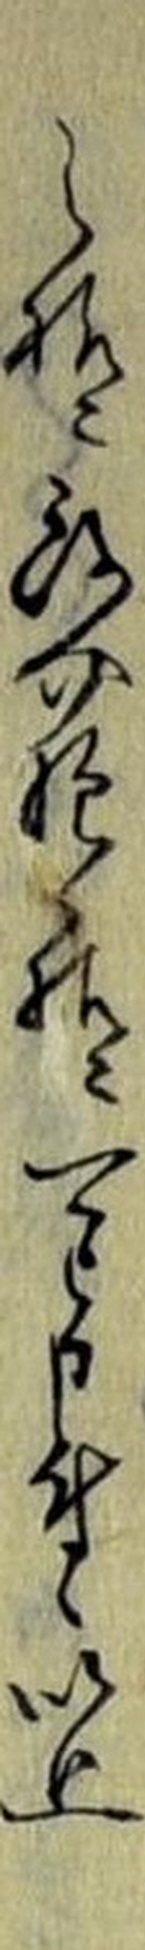之様に致介抱候様に可被申付候以上
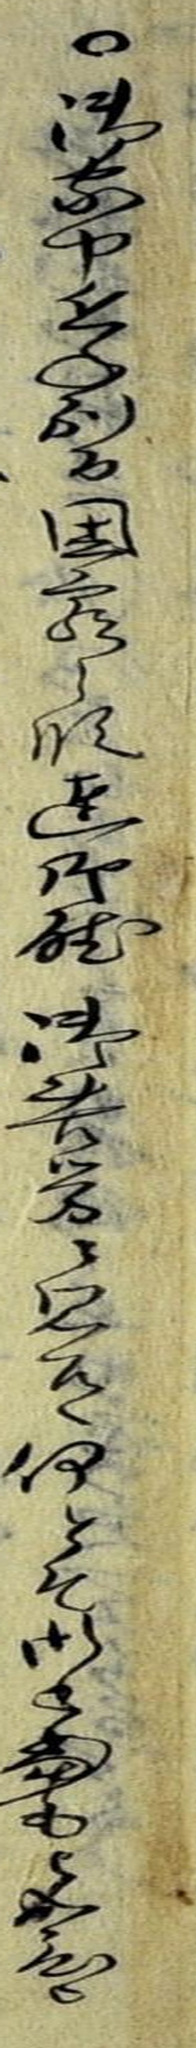〇御家中近年別而困窮之段達御聴御苦労に思召候何とそ御手当も被成度被
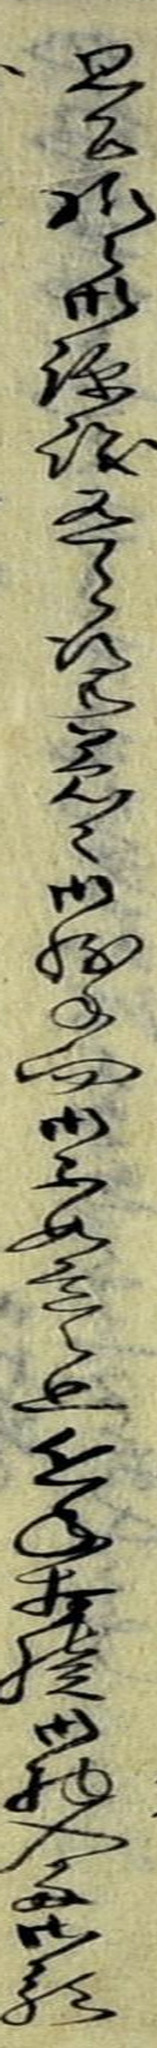思召様々御評儀有之候得共兼て御勝手向御不如意之上近年相続御物入多御難
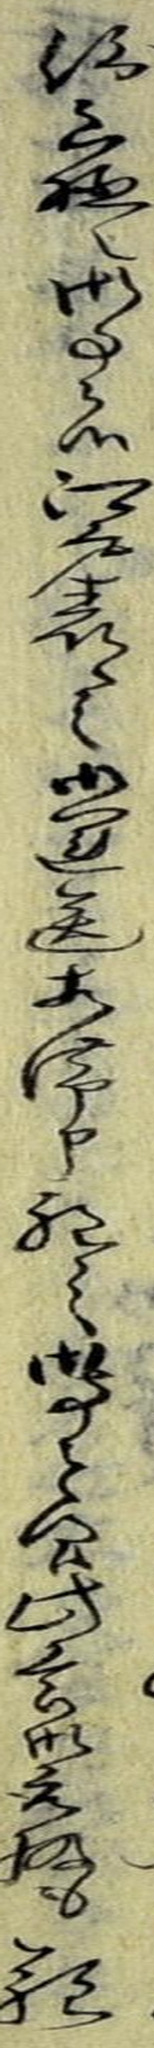儀至極之御事に候江戸表へ之御運送相滞申程之御事候得は此節御取扱も難
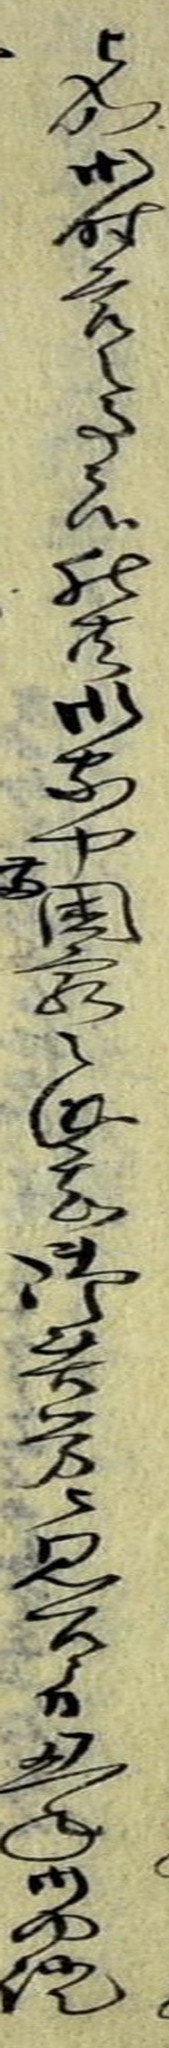被成御時節之事に候然共御家中困窮之趣甚御苦労被思召に付丑年御内証
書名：命令之部 二
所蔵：福井県文書館 Fukui Prefectural Archives
